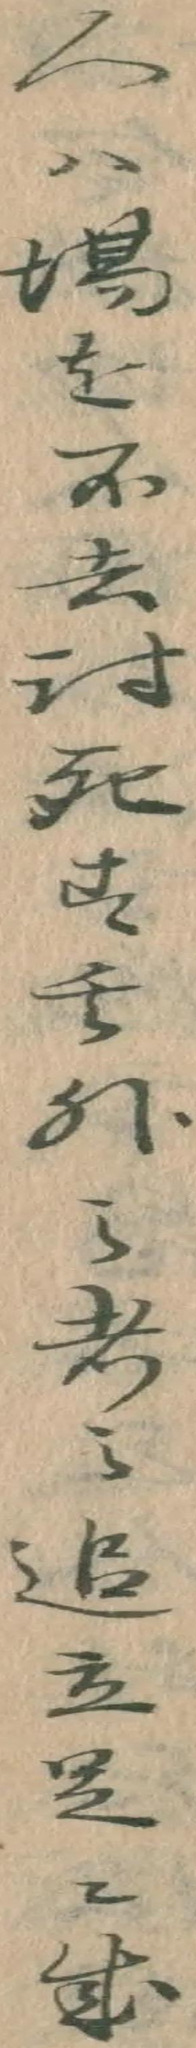人は場を不去討死春其外之者之追立足に成
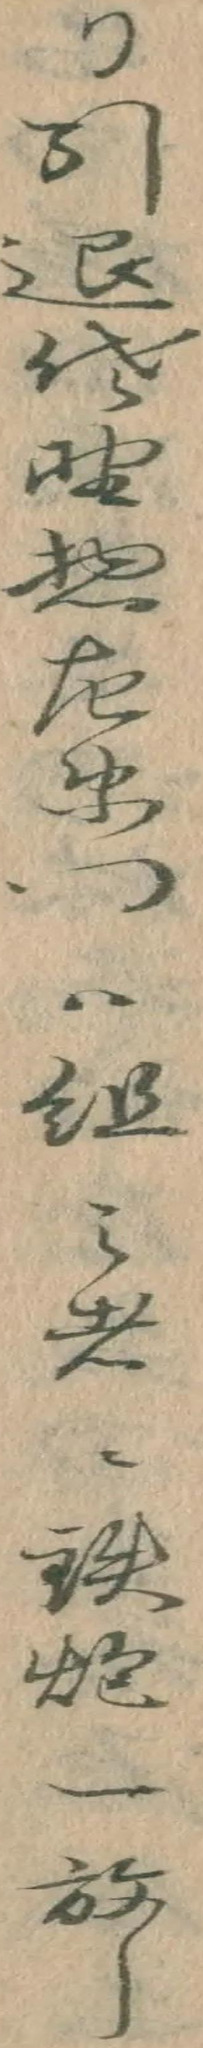り引退佐野惣左衛門は組之者に鉄炮一放し
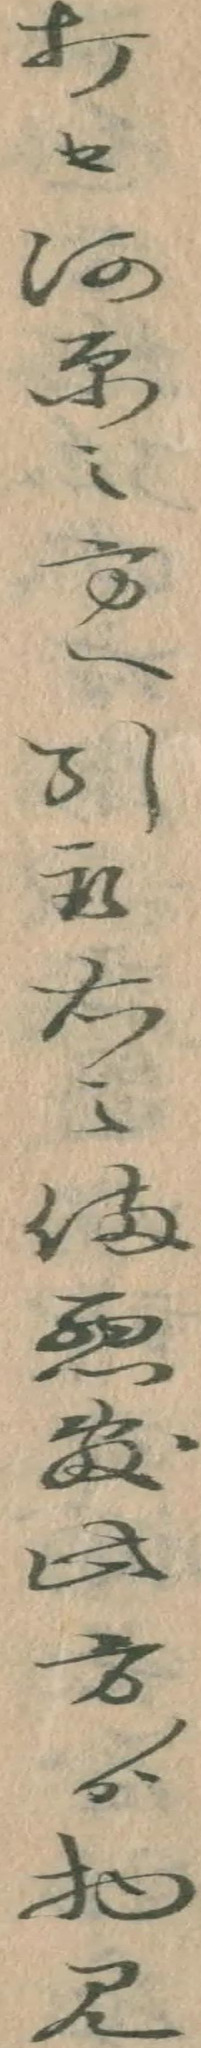打せ河原之方へ引取右之備悪敷此方ゟ物見
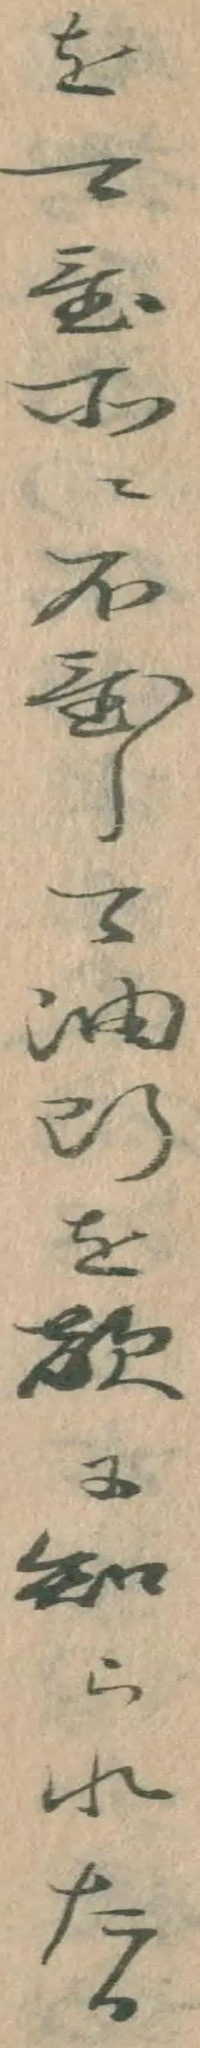を可置所に不置して油断を敵尓知られたる
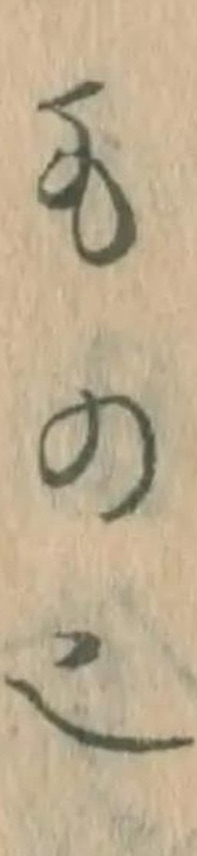もの也
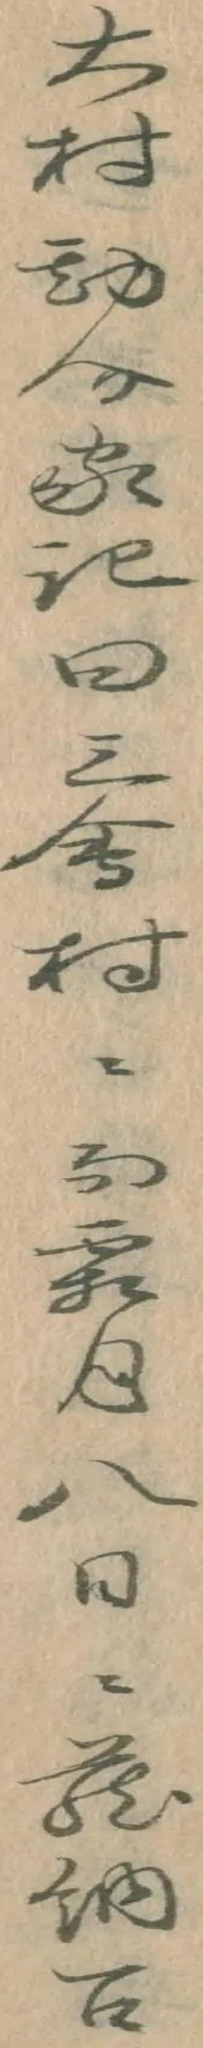大村勘介家記曰三会村に而霜月八日に蔵納召

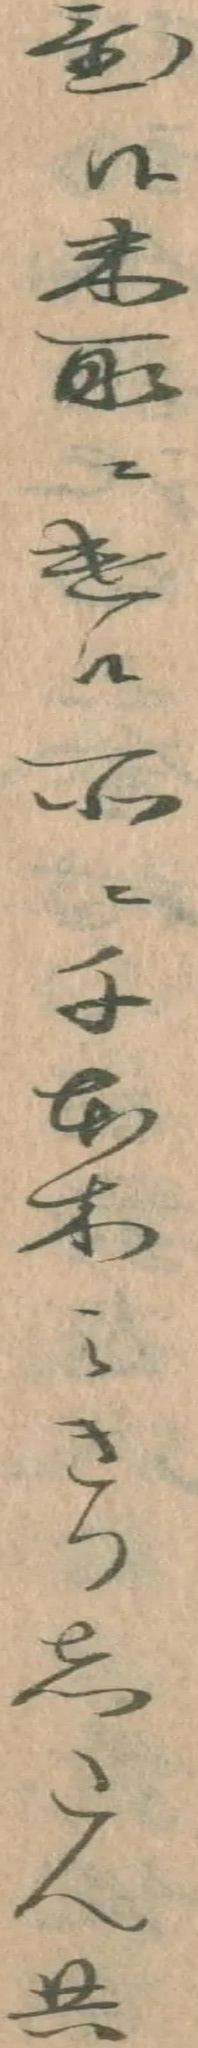置候末取に遣候所に千本木之きり志たん共
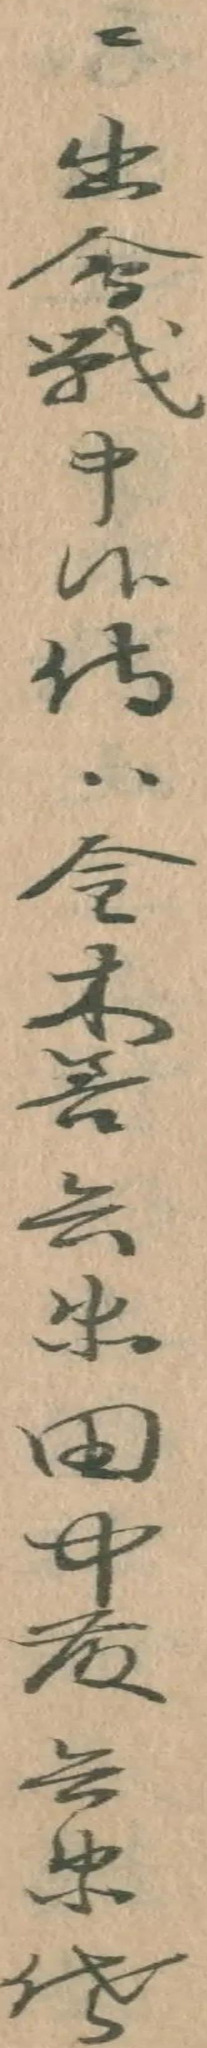に出会戦申候侍は金木善兵衛田中藤兵衛佐
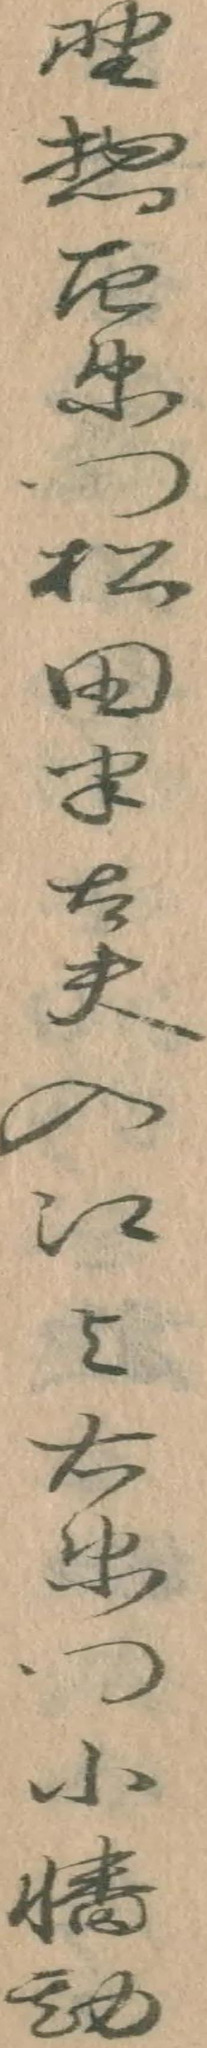野惣左衛門松田半太夫入江与右衛門小橋勘
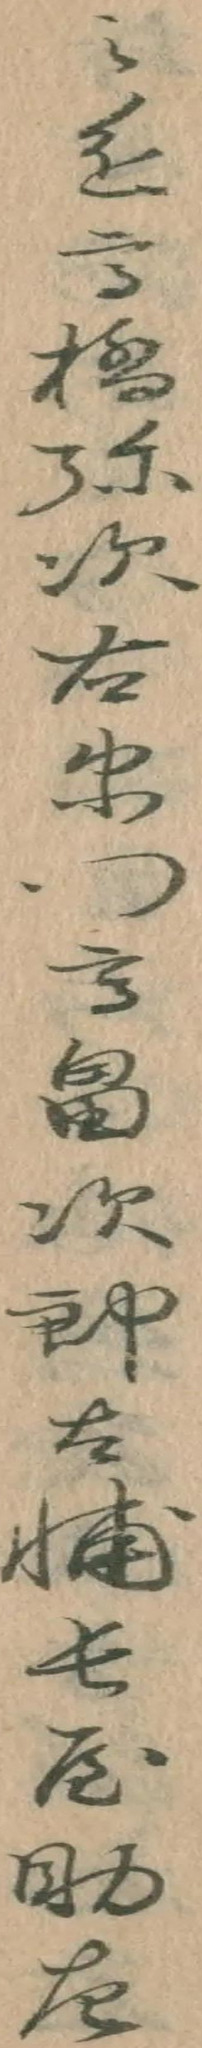之進高橋弥次右衛門高畠次郎太輔長屋助左
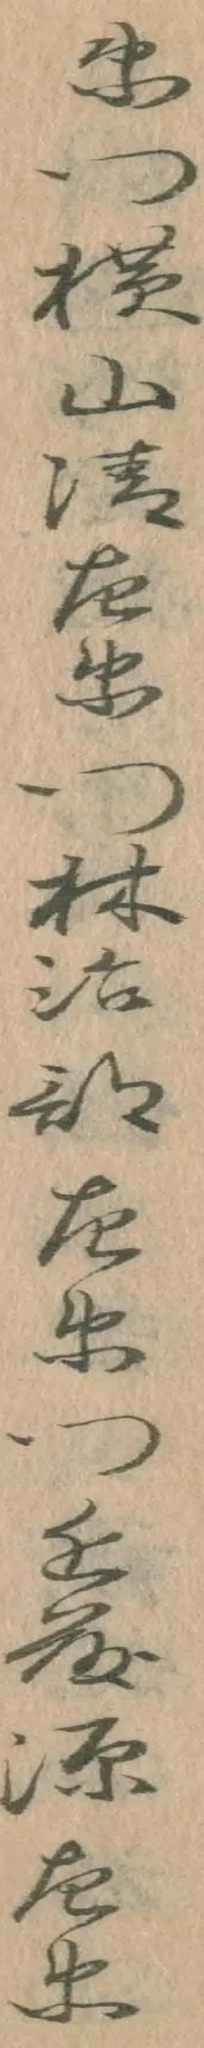衛門横山清左衛門林治部左衛門近藤源左衛
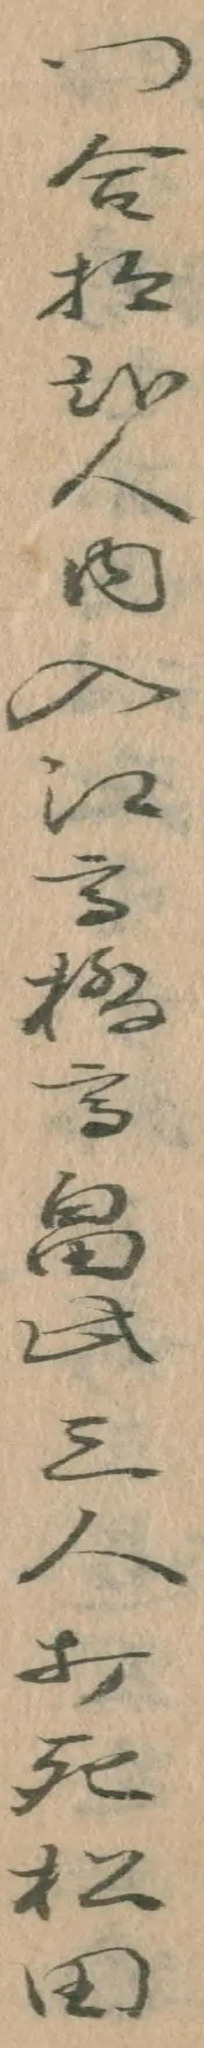門合拾弐人内入江高橋高畠此三人打死松田
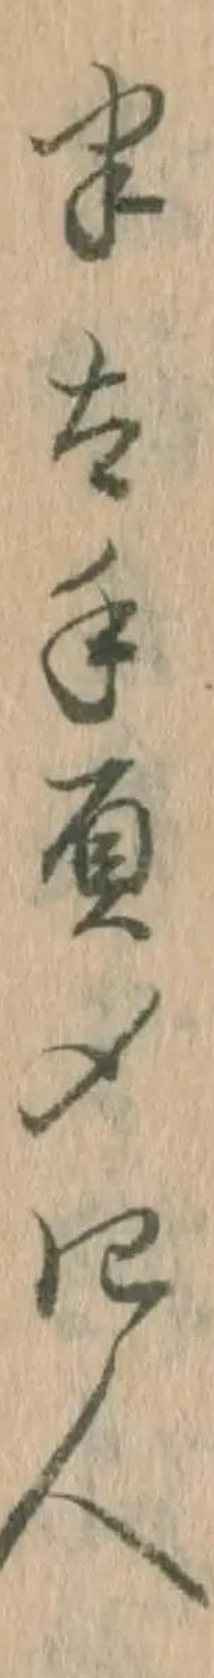半太手負〆四人
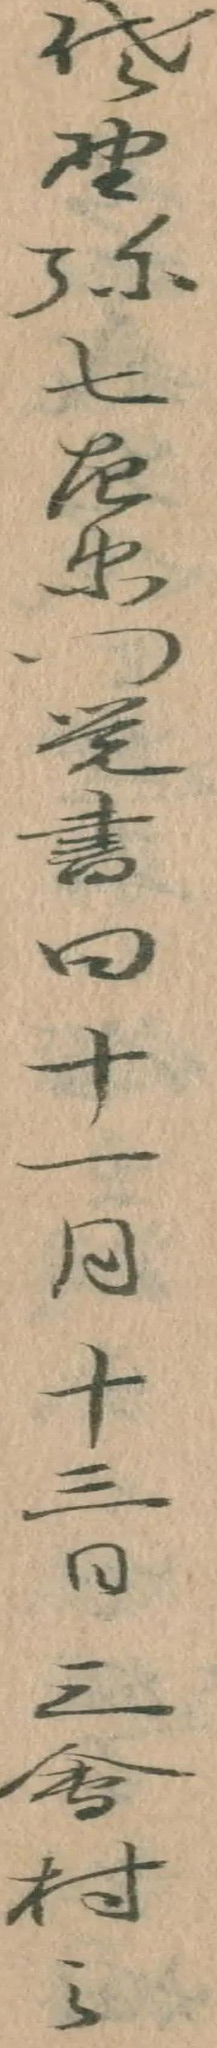佐野弥七左衛門覚書曰十一月十三日三会村之
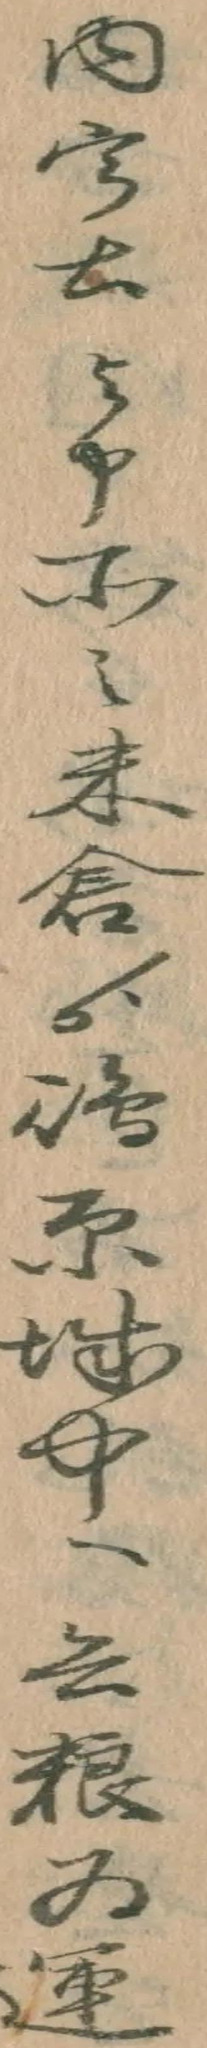内宇土与申所之米倉ゟ島原城中へ兵粮ゐ運
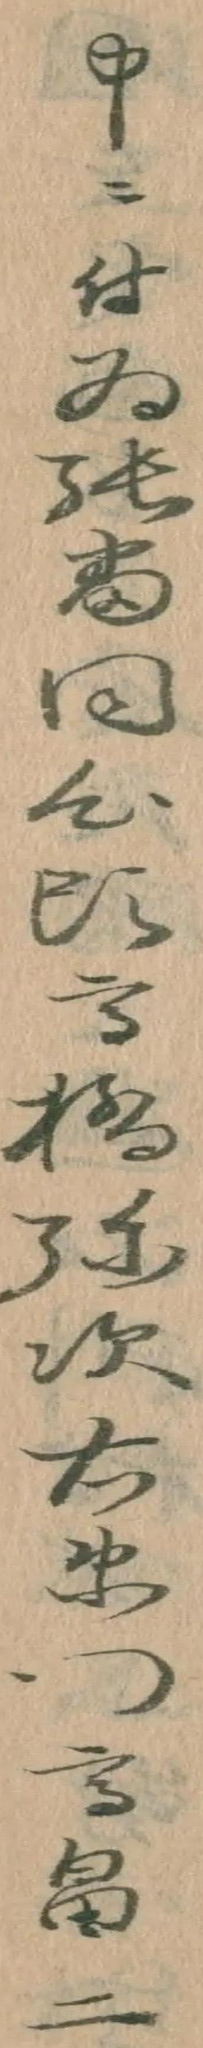申に付ゐ張番同心頭高橋弥次右衛門高畠二
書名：切支丹御退治記 49巻. [2]
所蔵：国立国会図書館 National Diet Library, JAPAN
